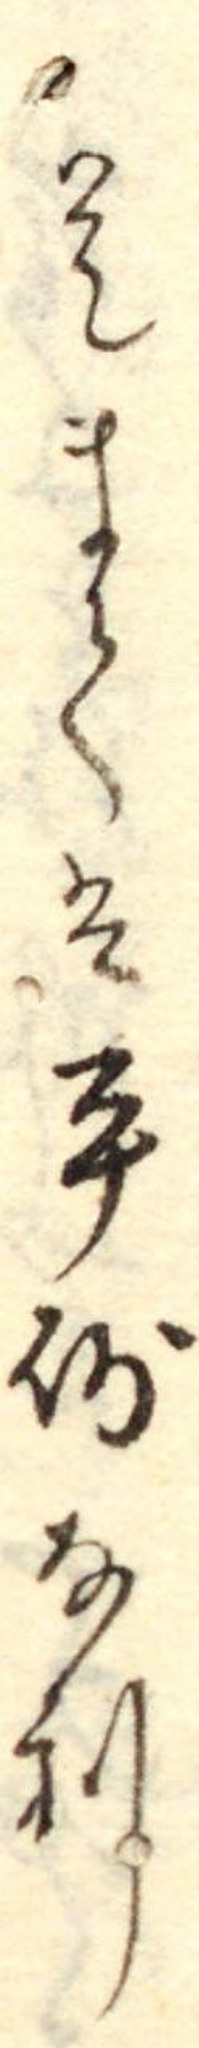是まては平份なり
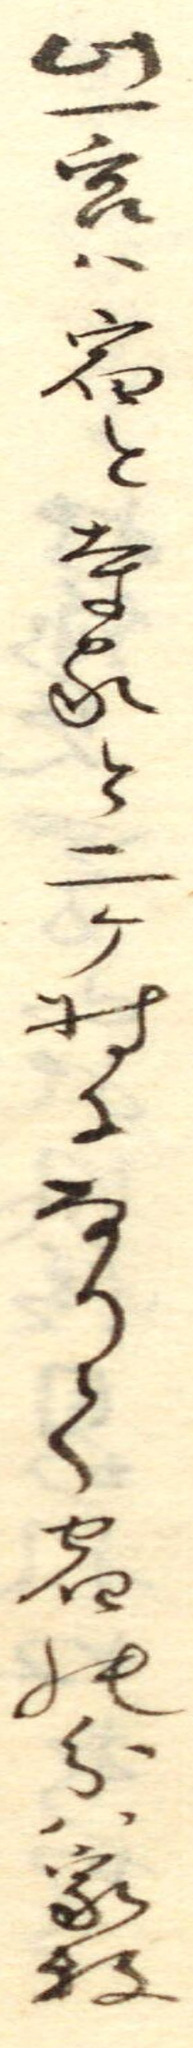此一宮は宿と寺家と二ヶ村になりて宿の分は家数
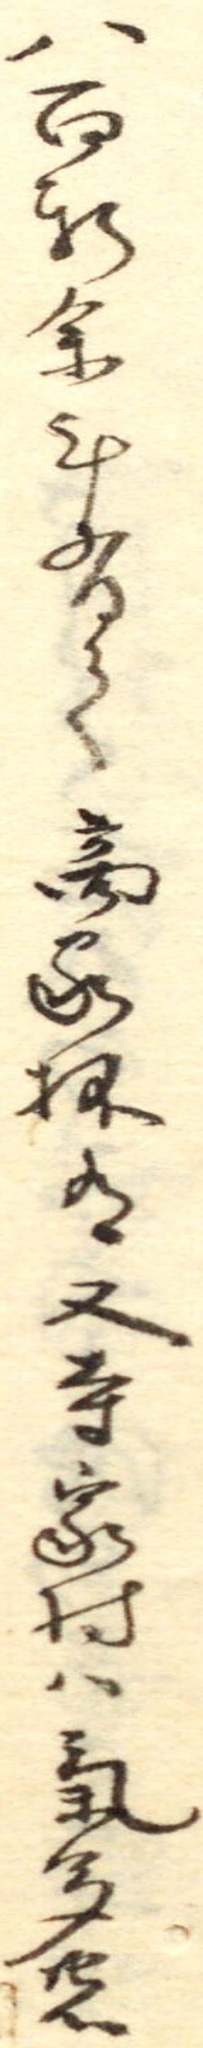は百軒余計有て商家抔有又寺家村は気多の
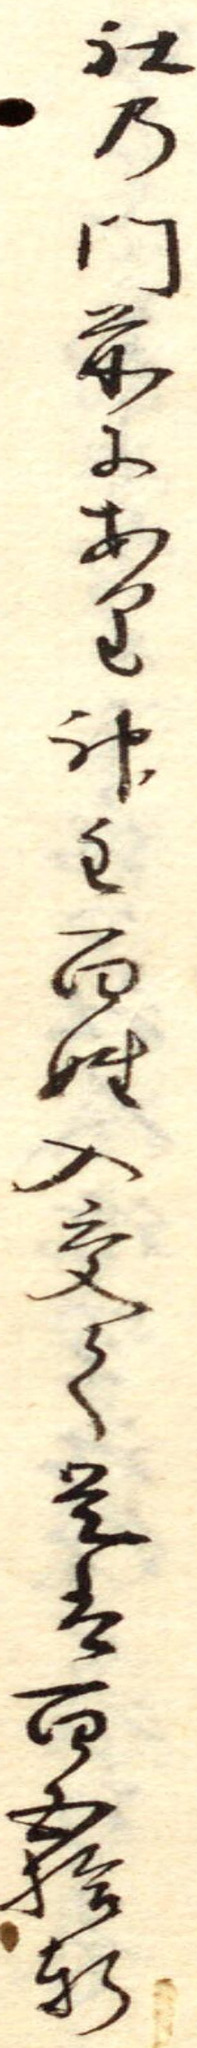社の門前にあり神主百姓入交て是は百五拾軒
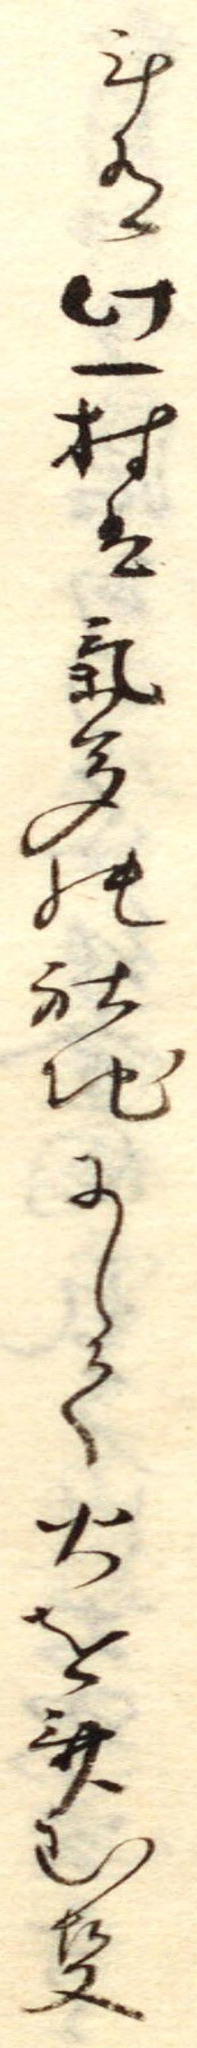計有此一村は気多の社地にして火を齋む事
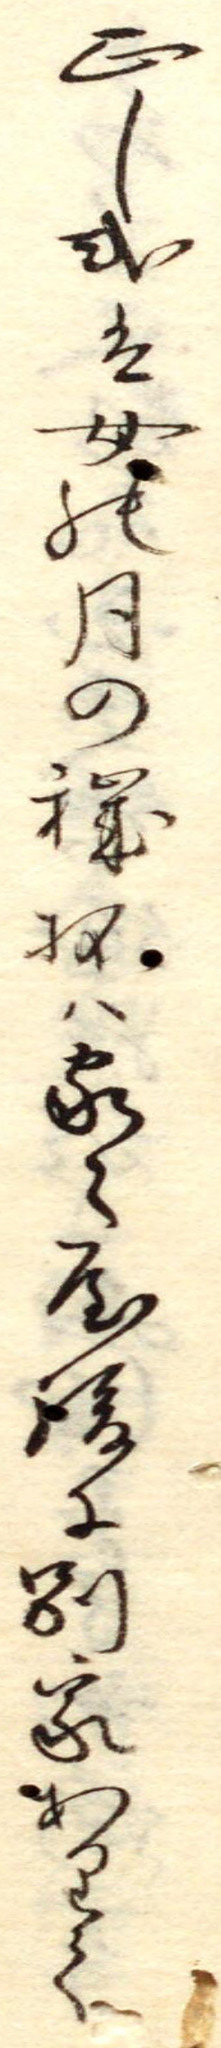正し式は女の月の穢抔は家之屋後に別家ありて
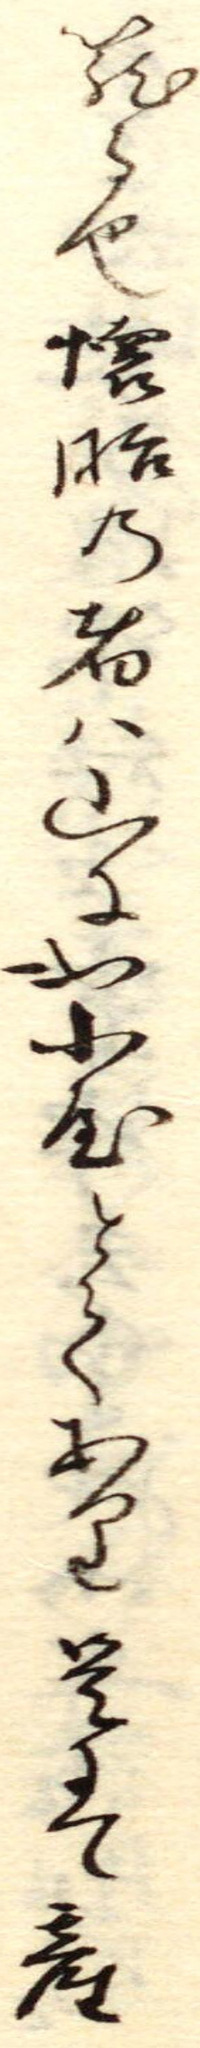籠る也懐胎の者は山に出小屋とてあり是にて産
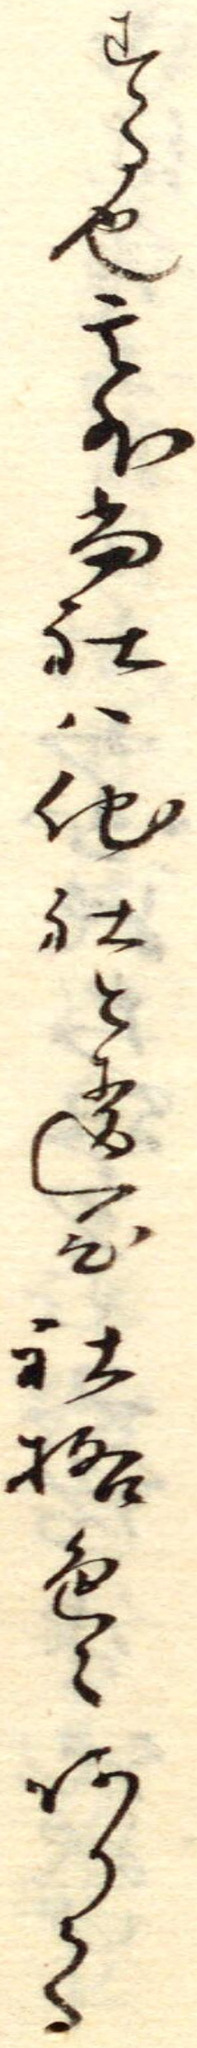する也其外当社は他社と違ひ社格色々ありて
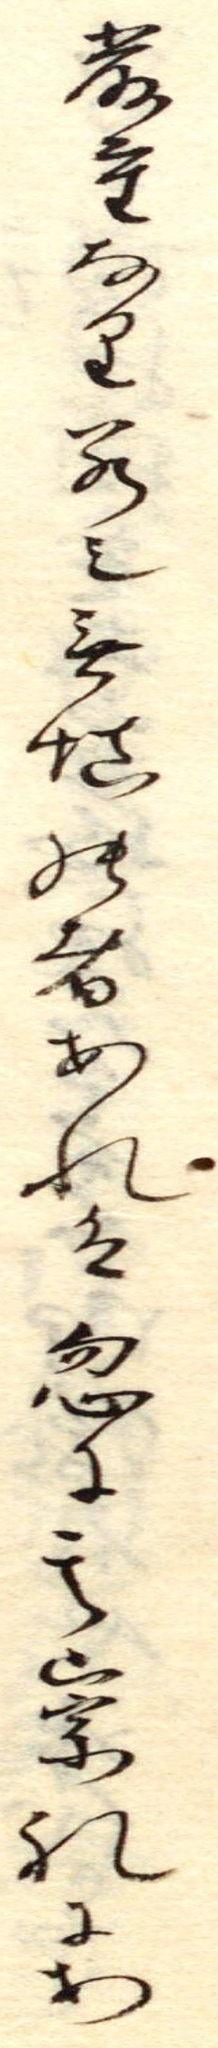厳重なり若し無慎の者あれは忽に其崇礼にあ
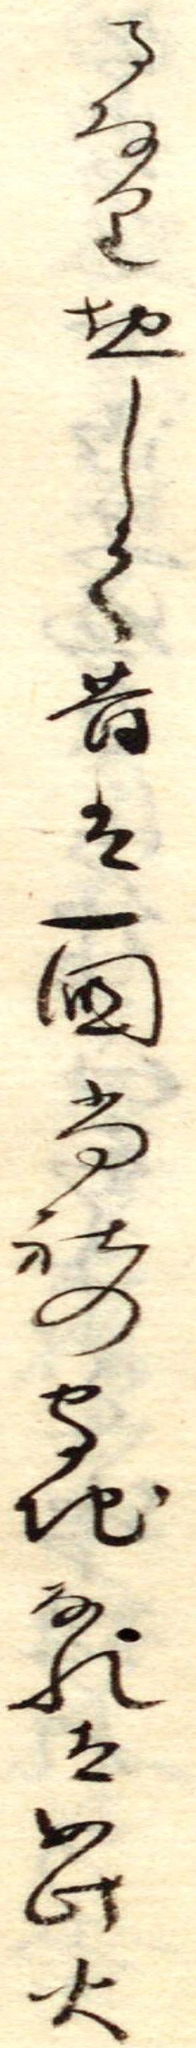るなり惣して昔は一国当社の守地なれは如此火
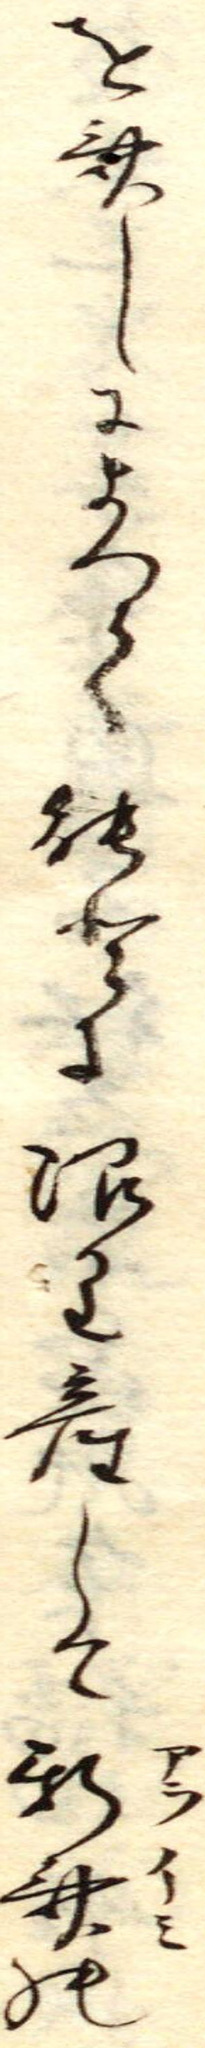を齋しによつて能登に浪主産して新齋の

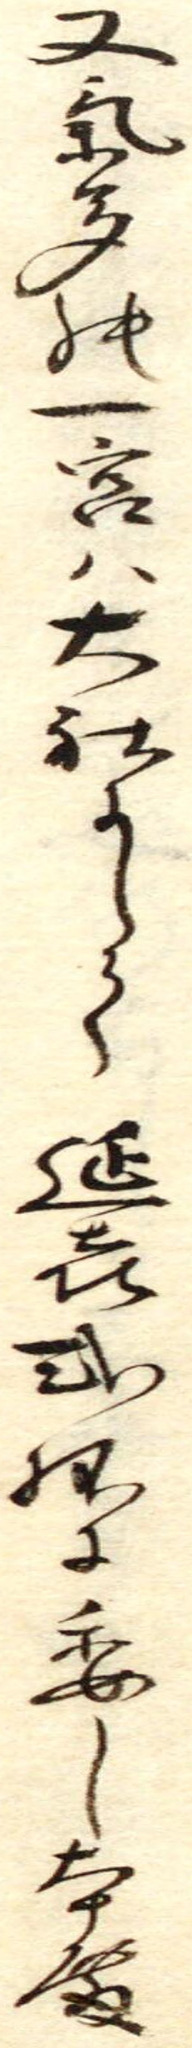又気多の一宮は大社にして延喜式抔に委し本殿
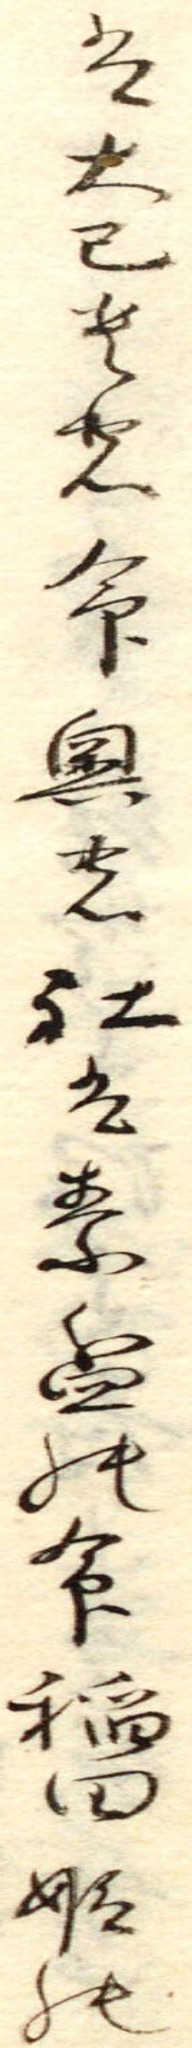は大己貴の命奥の社は素盃の命稲田姫の
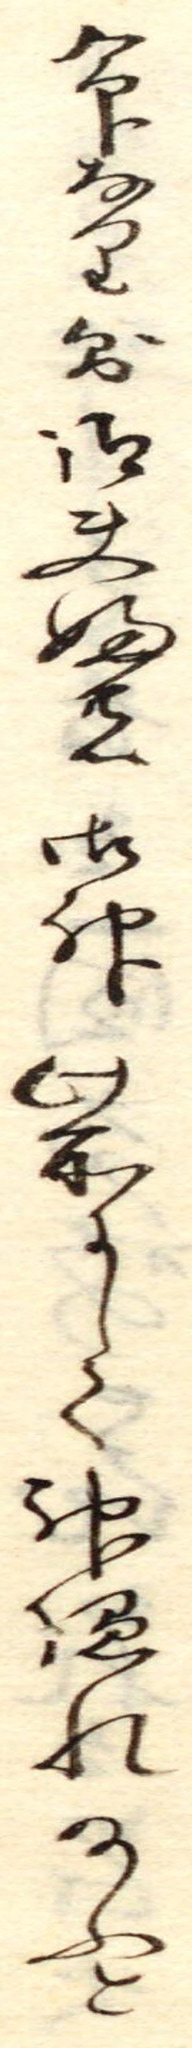命なり則御夫婦の御神此所にて神隠れ給ふと
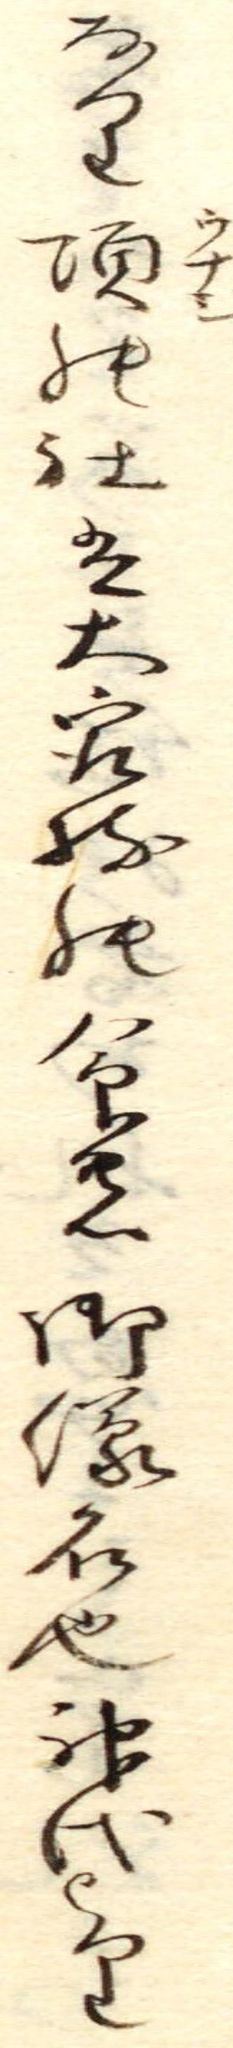なり頂の社は大最持の命の御像名也神代より
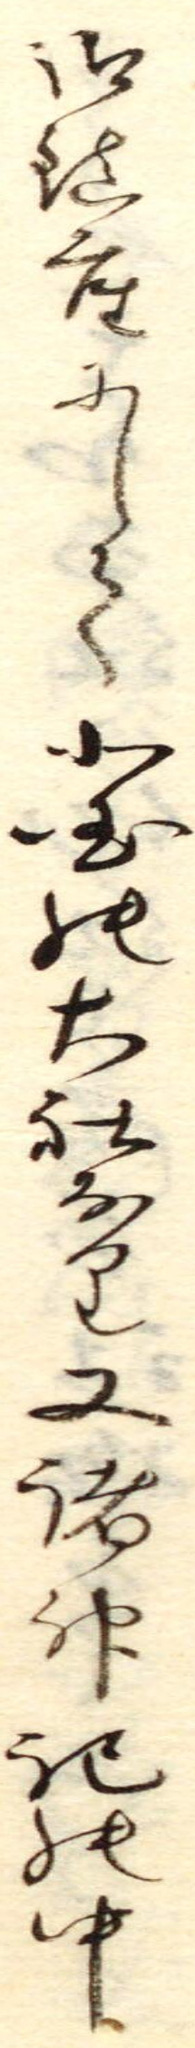御鎮座にして北国の大社なり又諸神記の中
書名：能登名跡誌
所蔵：Ishikawa Prefectural Library
